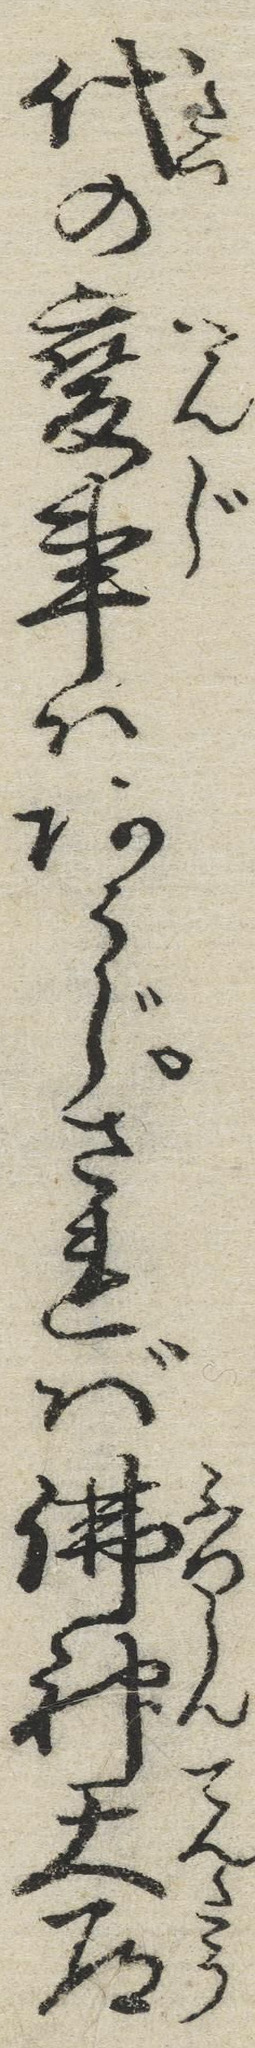代の変事はあらじ。されば佛神天道
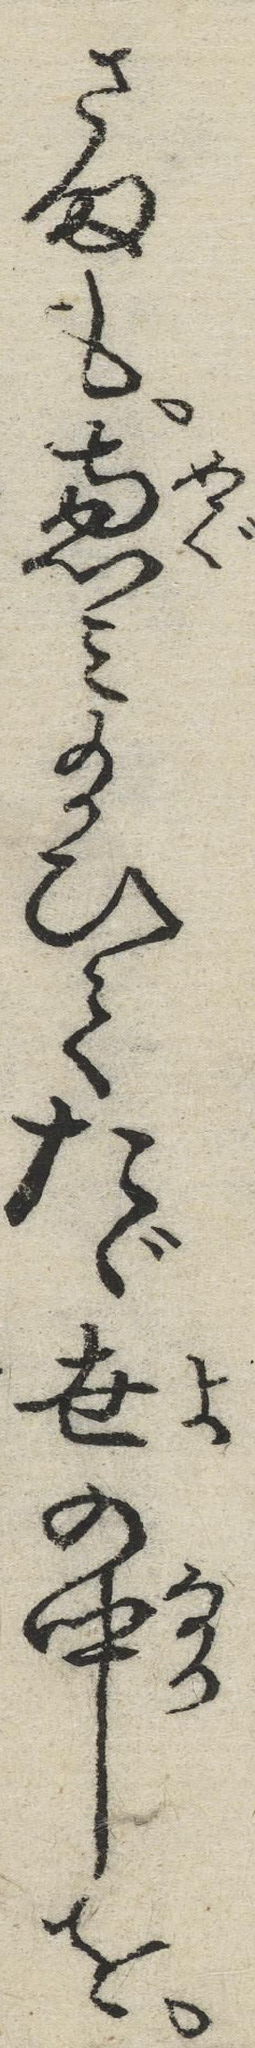さまも。恵み給ひてたヾ世の中を。
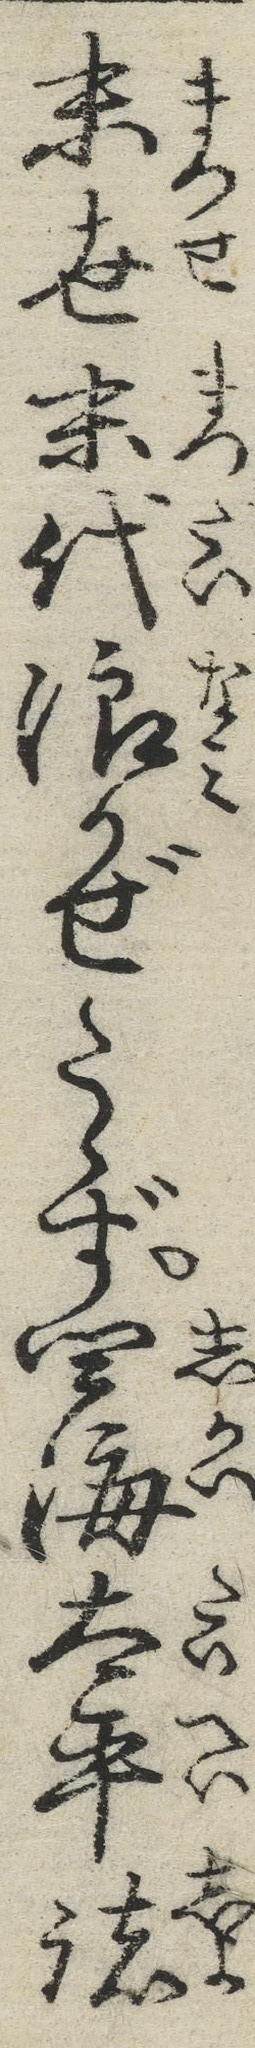末世末代浪かぜたゝず。四海太平諸
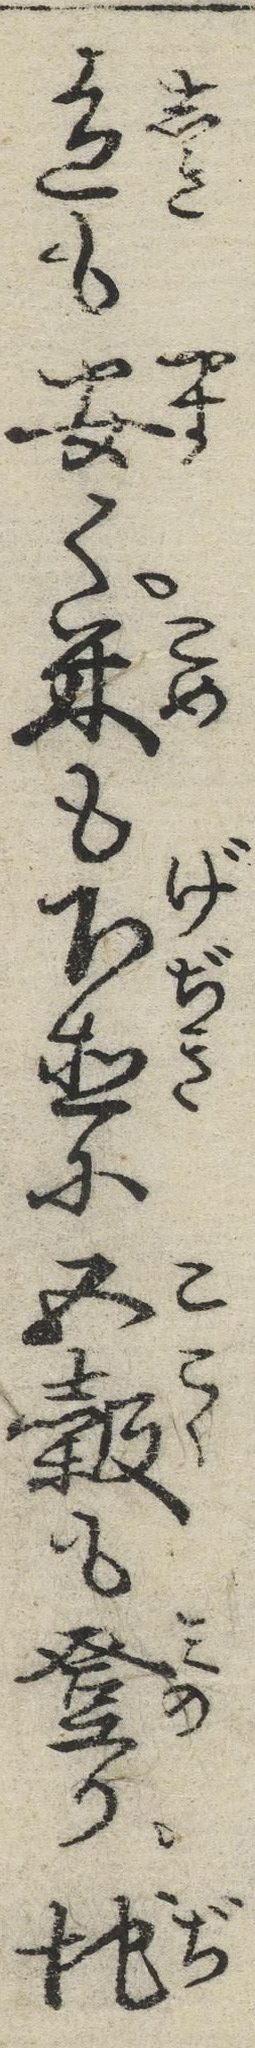色も安く。米も下直に五穀も登り。地
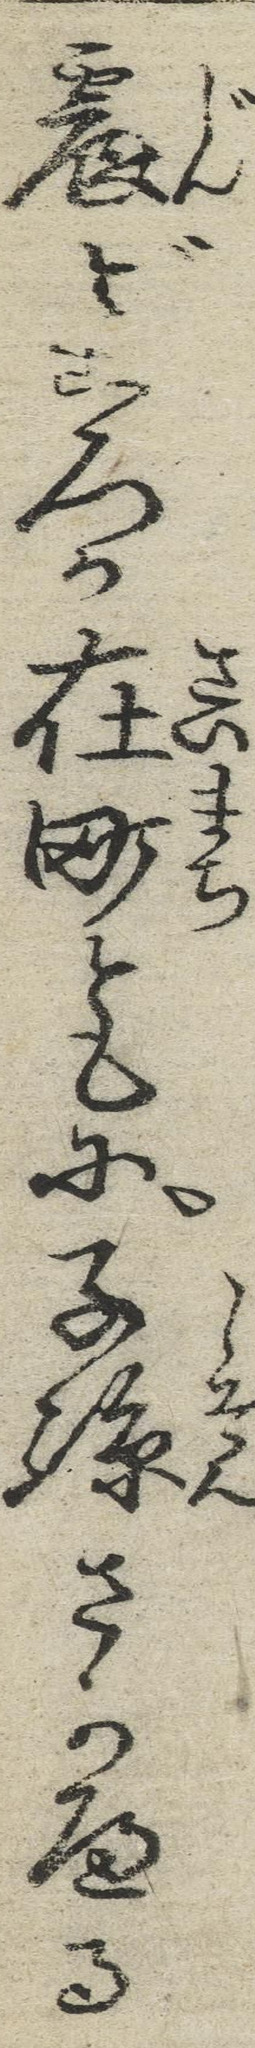震どころか在町ともに。子孫さかへる

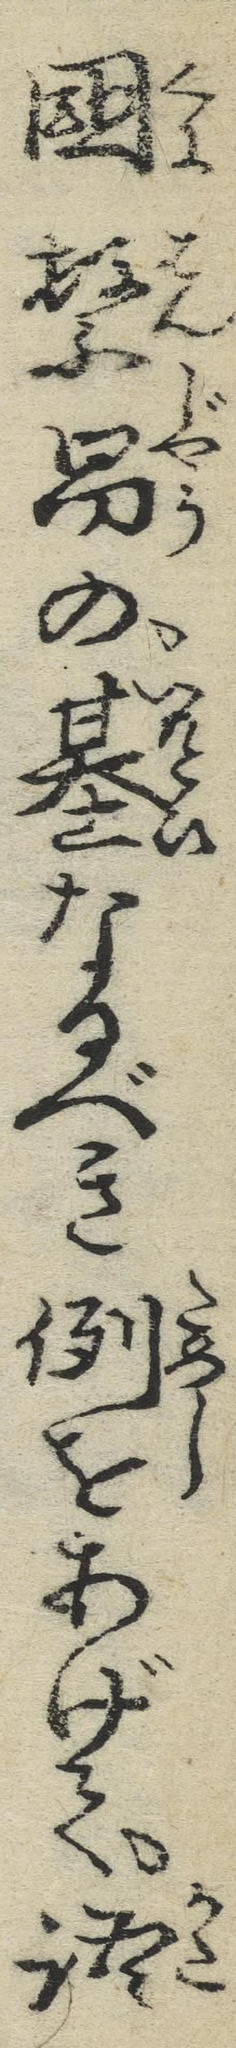國繁盛の基なるべき例をあげて。語
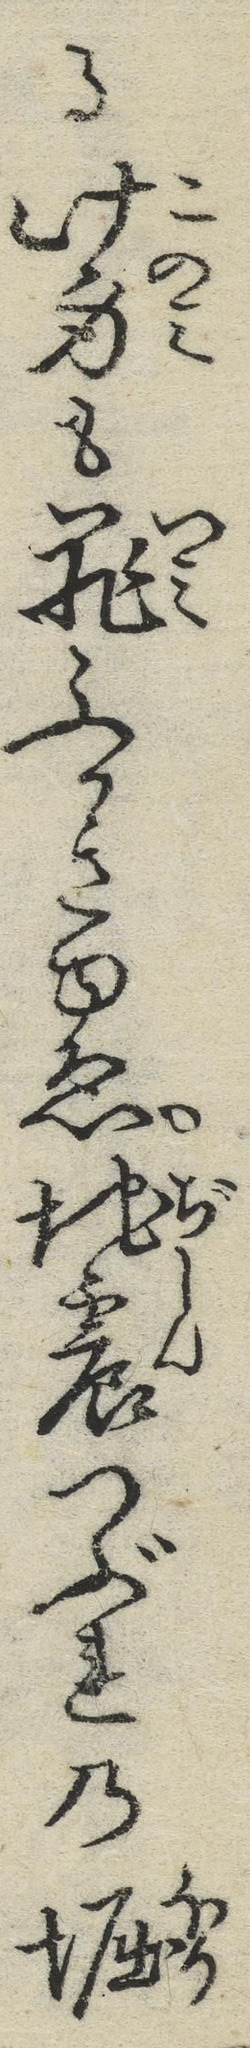る此身も罪ふかきゆゑ。地震つぶれの堀
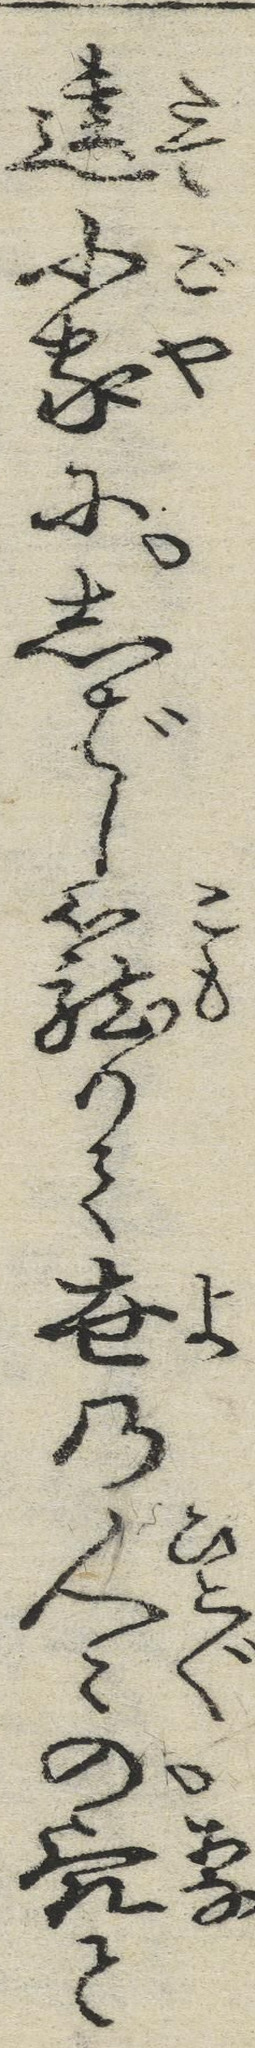建小家に。しばし籠りて世の人〻の。穴と
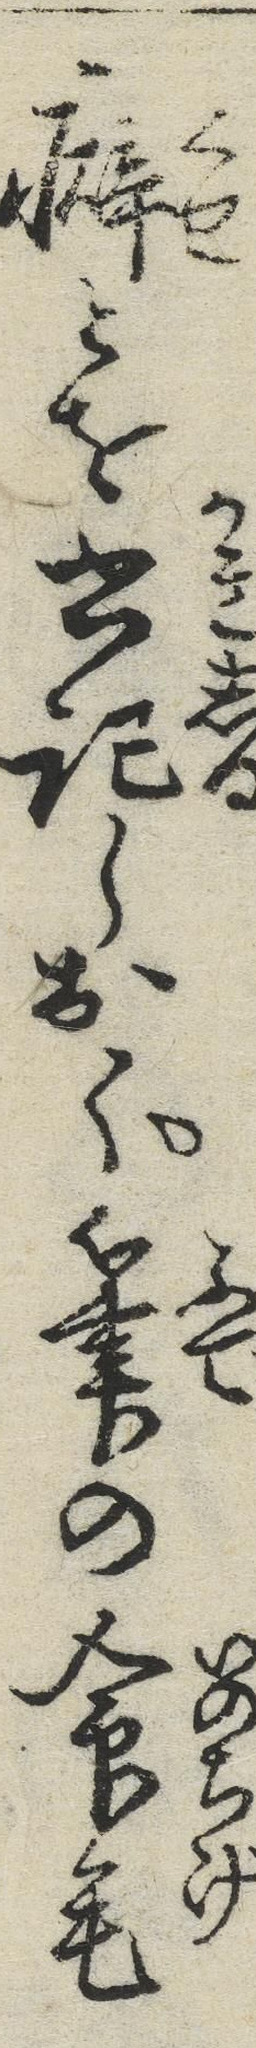癖らを書記しおく。筆の命毛
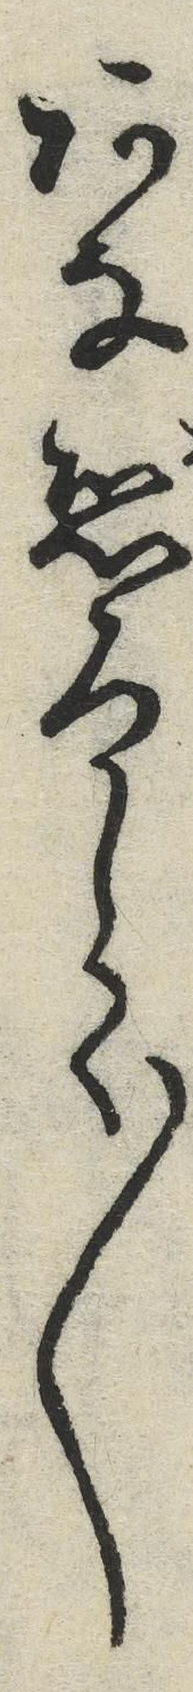あな恐ろしや〳〵
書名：越後地震口説
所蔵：東京大学地震研究所図書室 Earthquake Research Institute Library, The University of Tokyo, JAPAN
